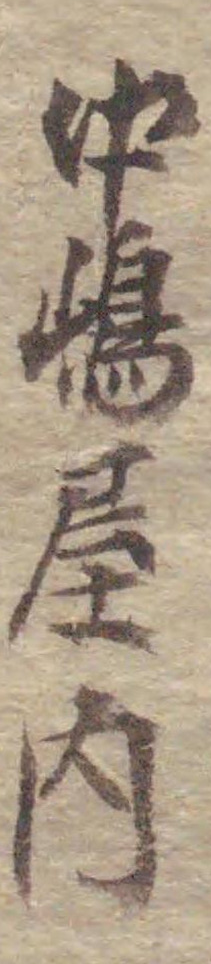中嶋屋内
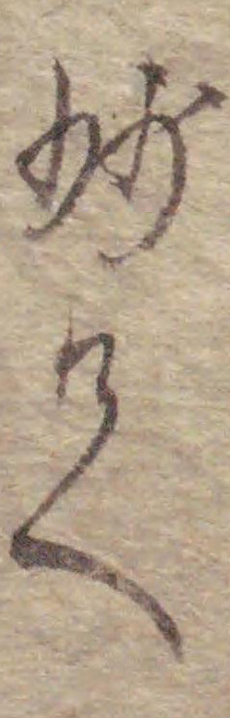妙けん

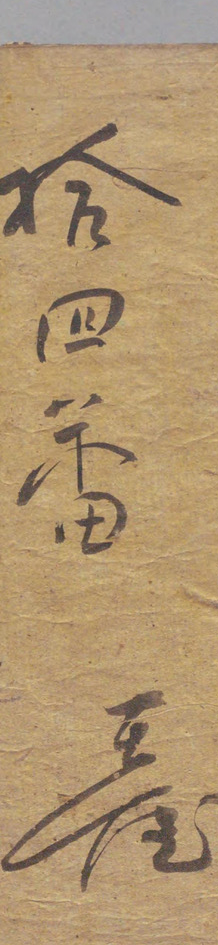拾四番臺
